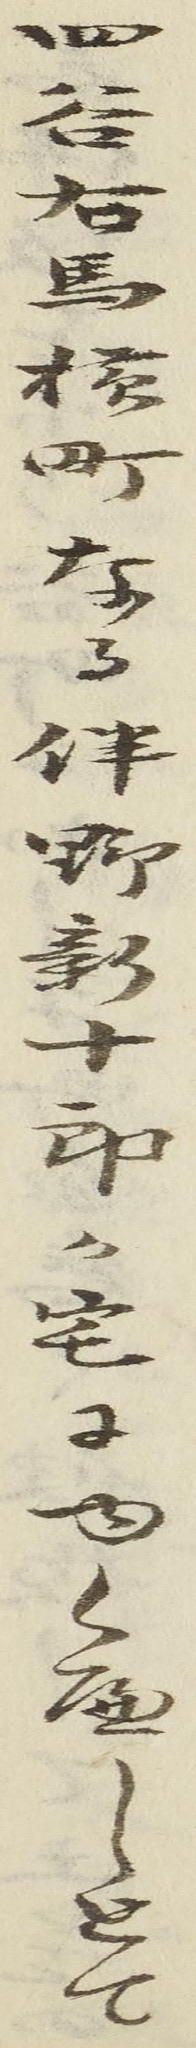四谷右馬横町なる伴野新十郎か宅にゆくへしとて

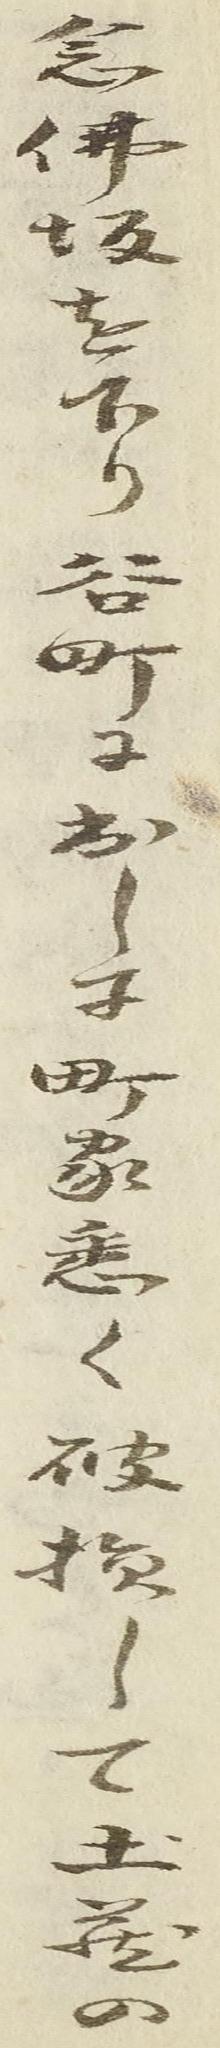念仏坂を下り谷町に出しに町家悉く破損して土蔵の
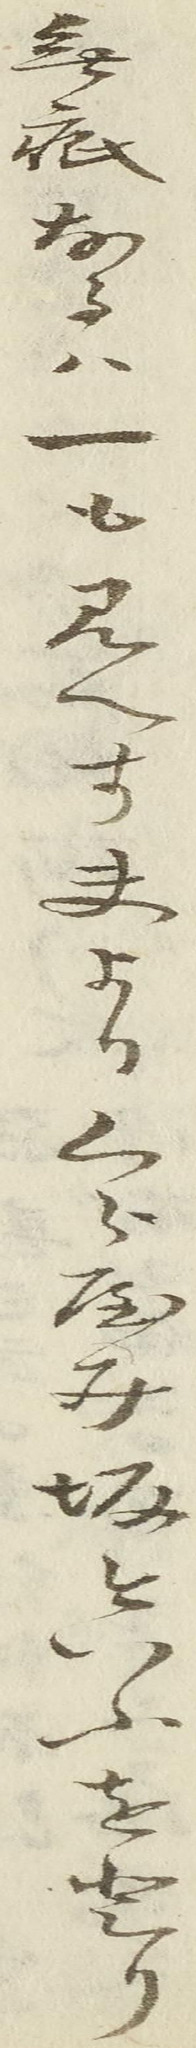無疵なるハ一も見へす夫よりくらやみ坂といふを登り
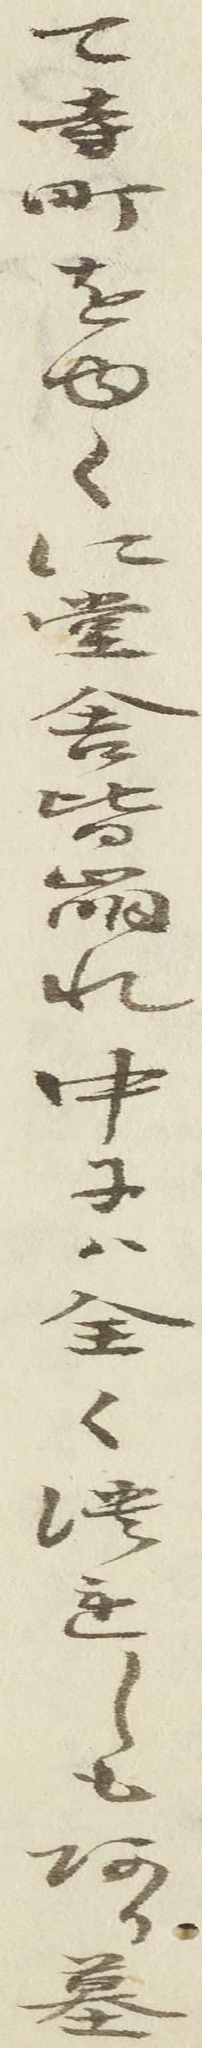て寺町をゆくに堂舎皆崩れ中にハ全く潰れしもあり墓
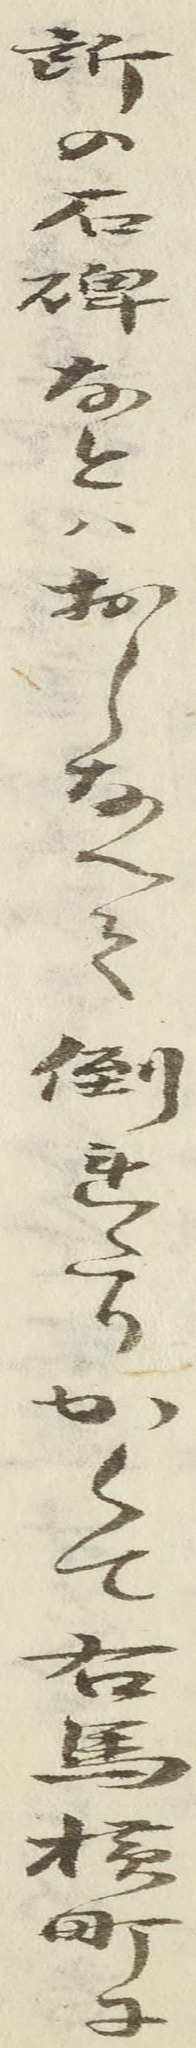所の石碑なとハおしなへて倒れたりかくて右馬横町に
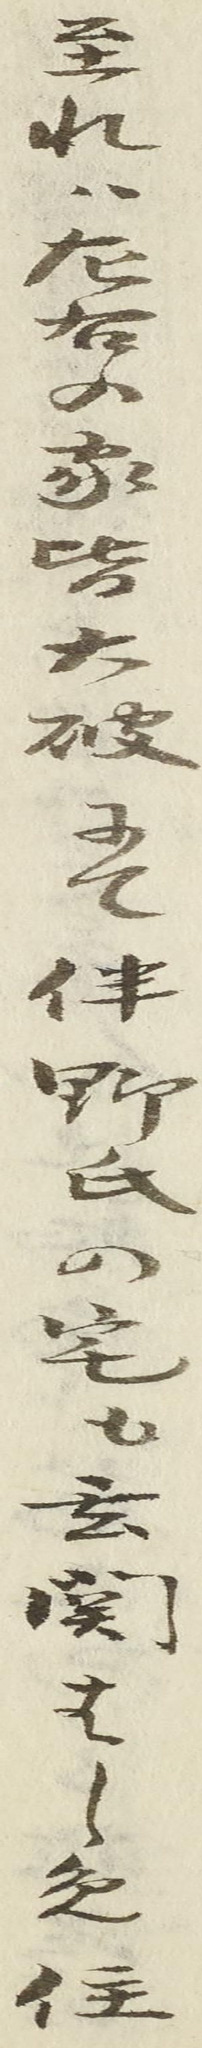至れハ左右の家皆大破にて伴野氏の宅も玄関はしめ住
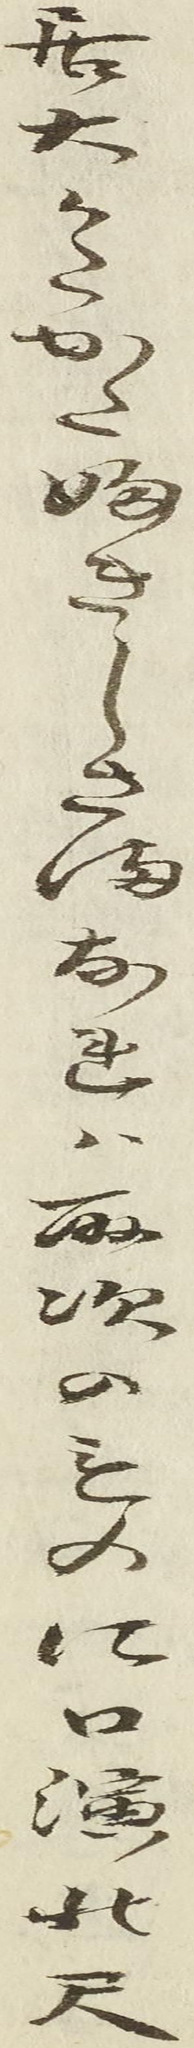居大かたかたふきしさまなれハ取次のものに口演の尺
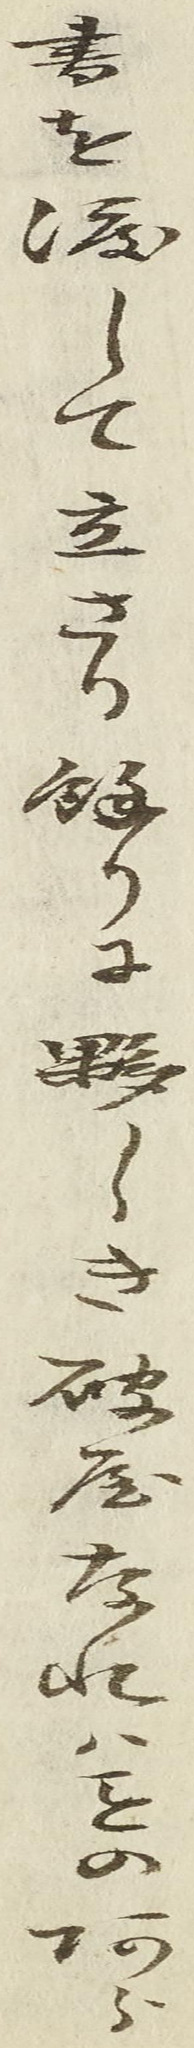書を渡して立さり餘りに夥しき破屋なれハことのあら
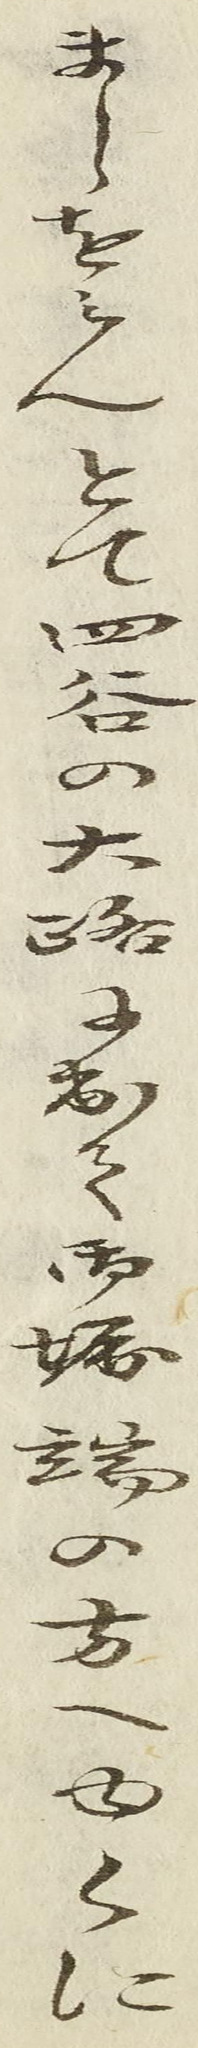ましをミんとて四谷の大路に出て御堀端の方へゆくに
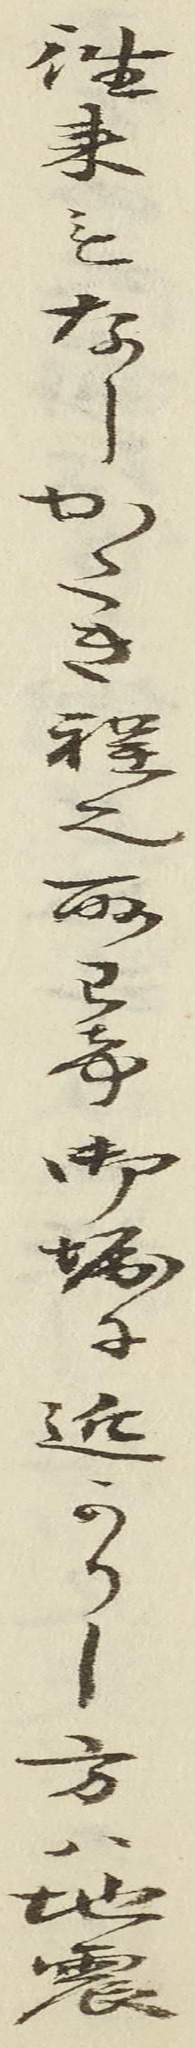往来もなしかたき程也最わき御堀に近かりし方ハ地震
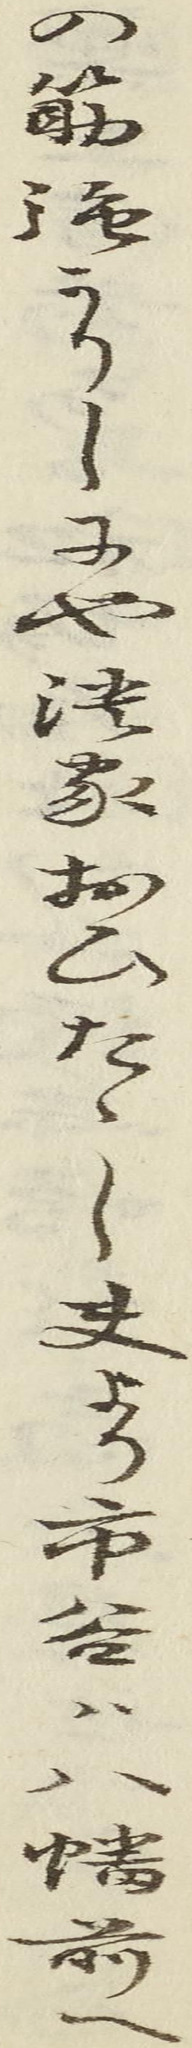の筋強かりしにや潰家おひたゝしく夫より市谷ハ八幡へ
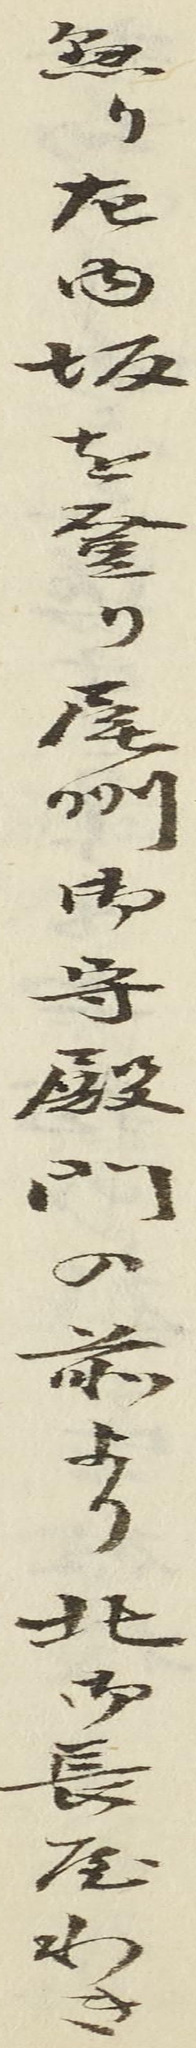懸り佐内坂を登り尾州御守門の前より北御長屋わき
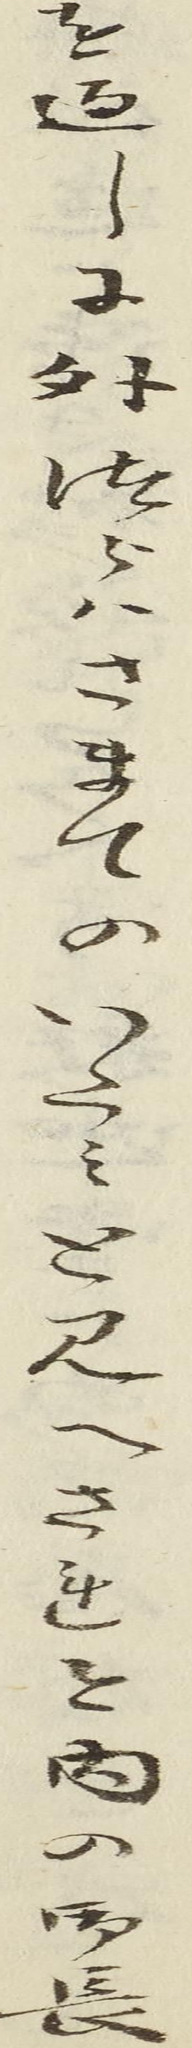を過しに外つらハさまてのいたミと見へされと内の御長
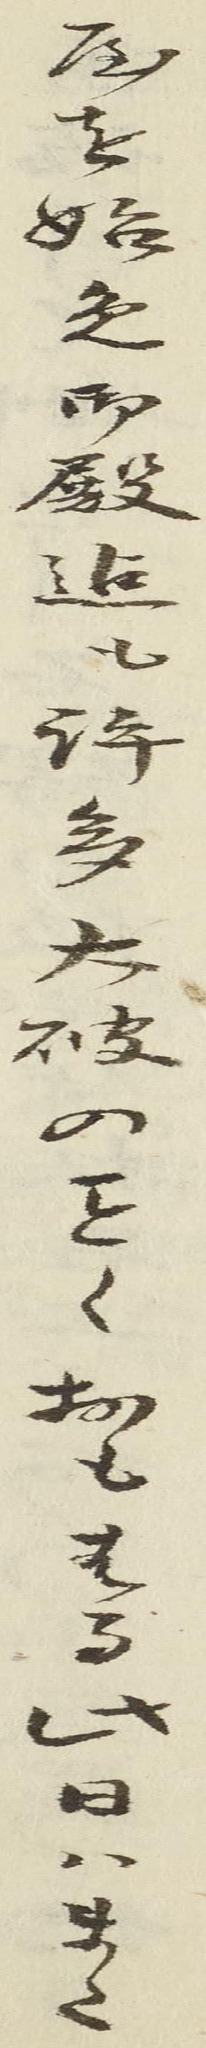屋を始め御殿迄も許多大破のことくおもはる此日はまた
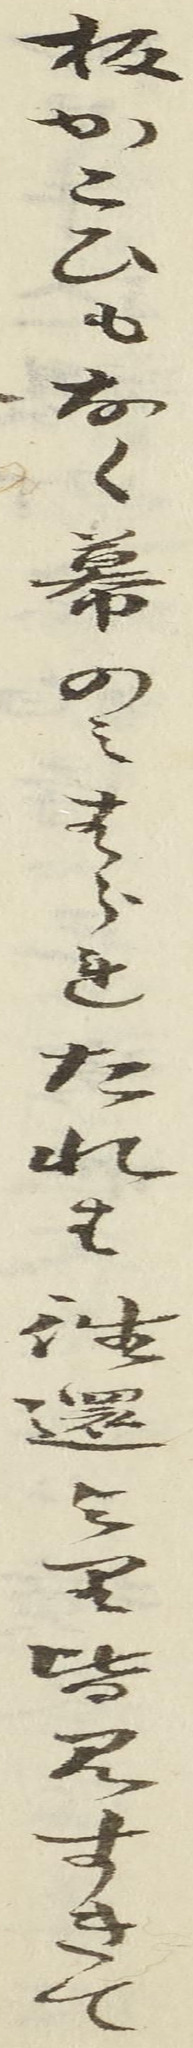板かこひもなく幕のミはられたれハ往還より皆見すきて
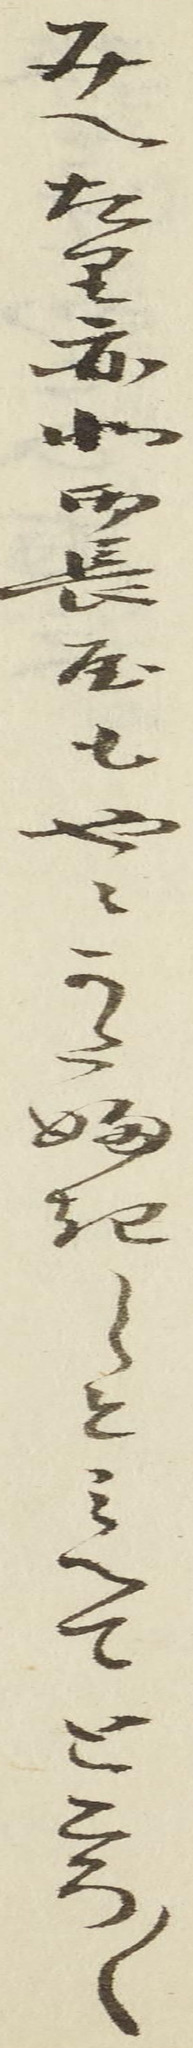みへたり亦北御長屋もやゝかたふきしとミへてところ〳〵
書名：那為の後見艸　全
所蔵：東京大学地震研究所図書室 Earthquake Research Institute Library, The University of Tokyo, JAPAN
